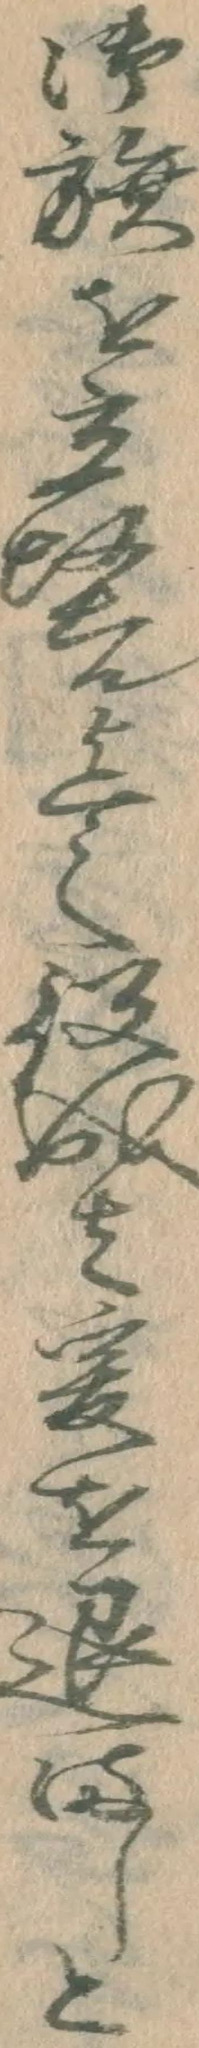御旗を立堅る迄之役成者爰を退扁しと
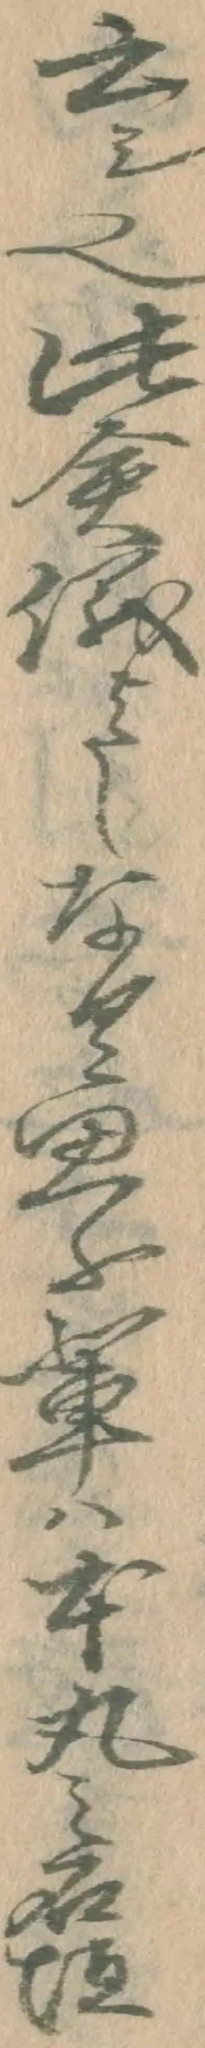云し也此僉儀与しな具思ふ輩は本丸之石垣
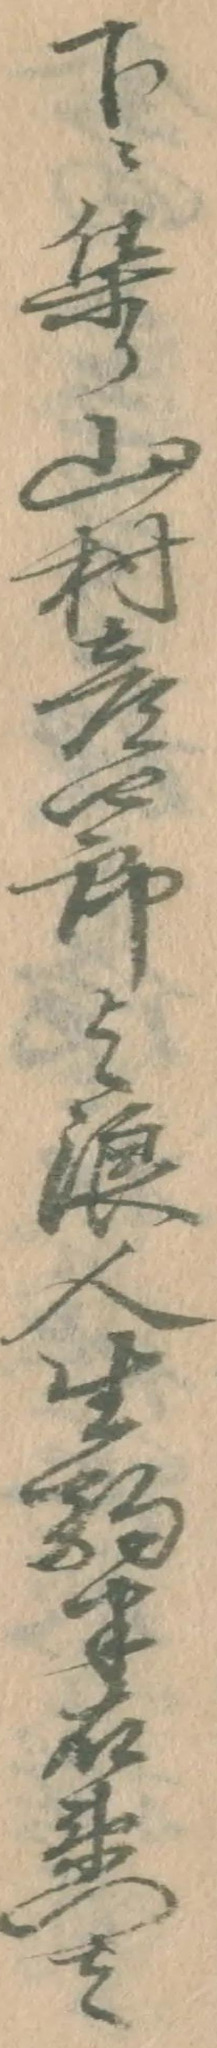下に集り山村彦四郎与浪人生駒半右衛門者

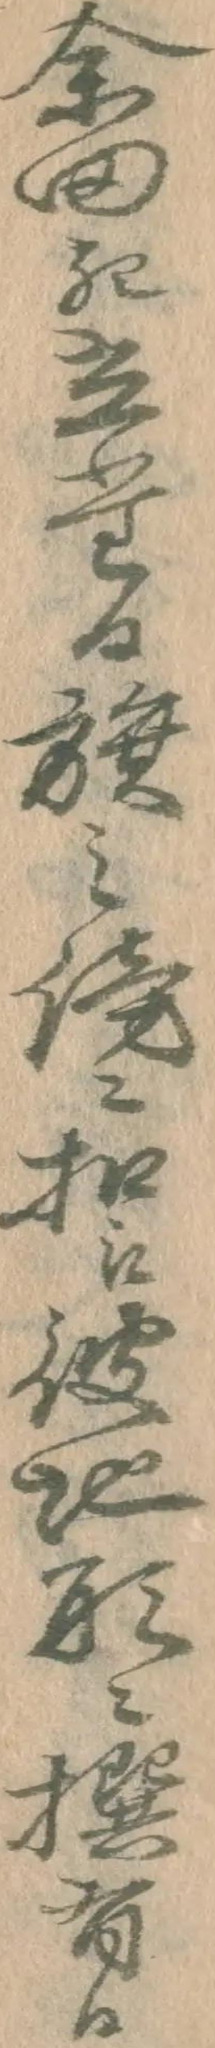余田歟立堂る旗之傍に扣江彼地形に撰有る
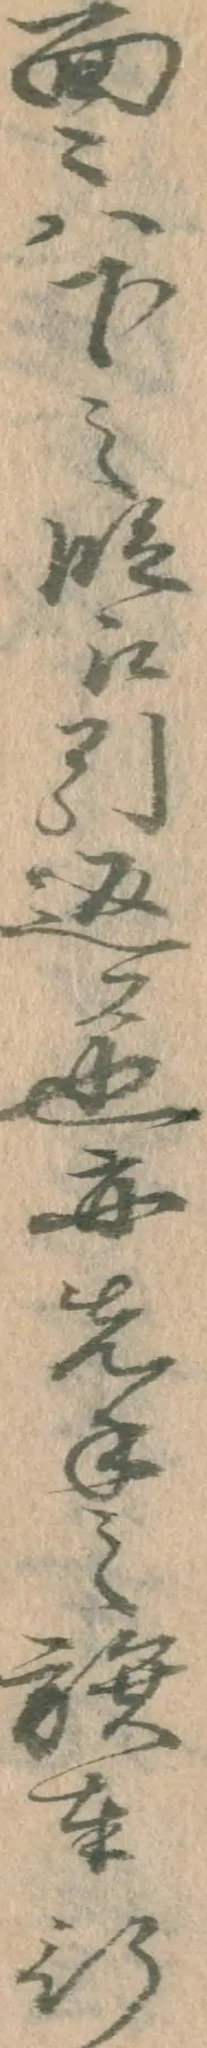面々は下之段江引返す也亦先手之旗奉行
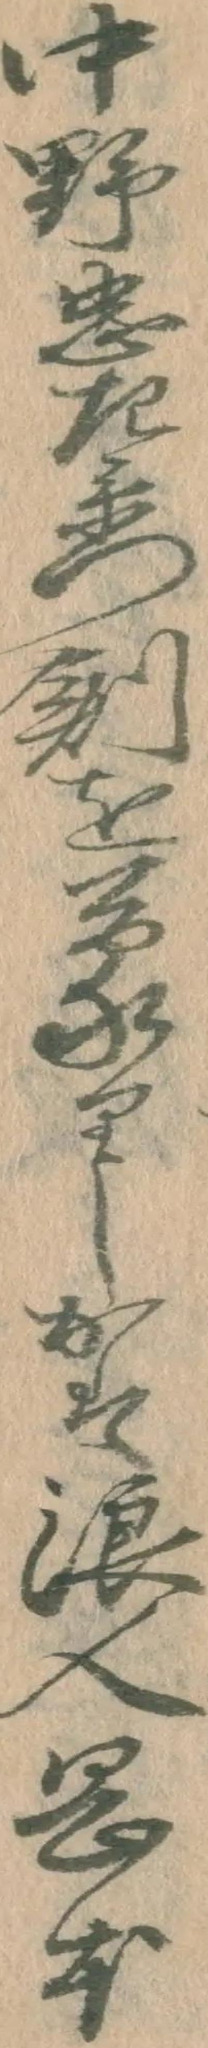中野忠左衛門創を承里しか盤浪人岡本
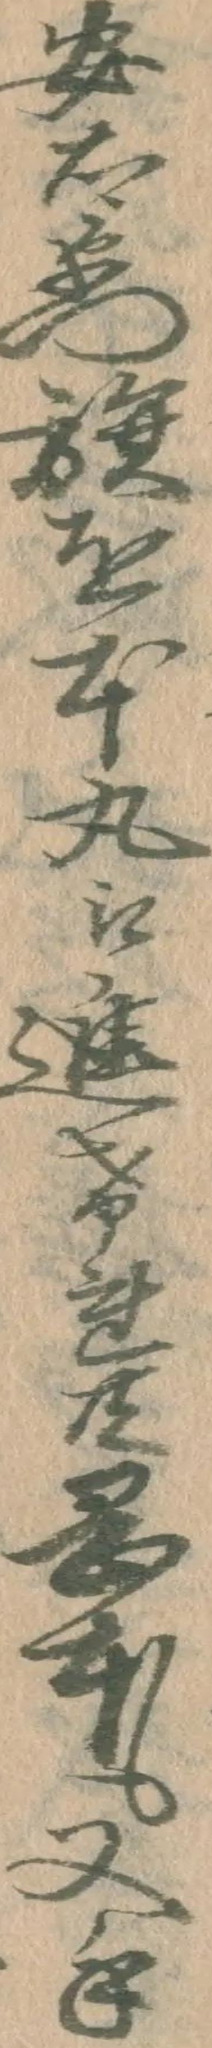安右衛門旗を本丸江進希連共岡本も又手
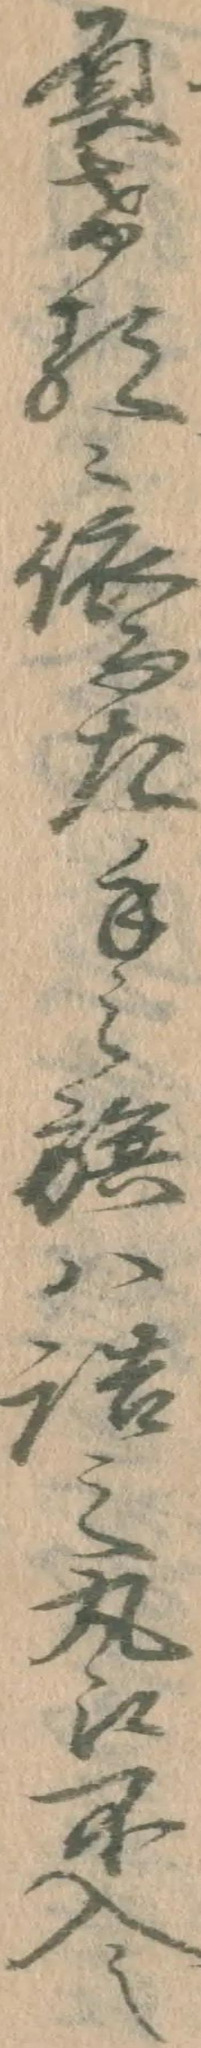負希類に依而左手之旗は詰之丸江不入之
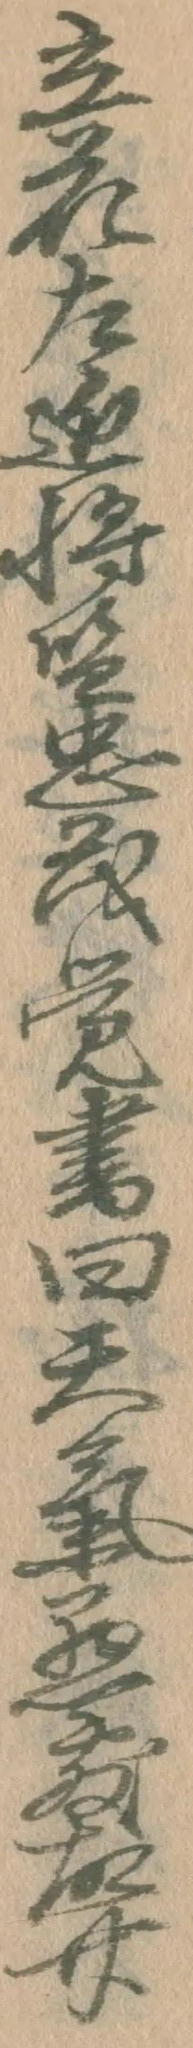立花左近将監忠茂覚書曰天気悪敷故廿
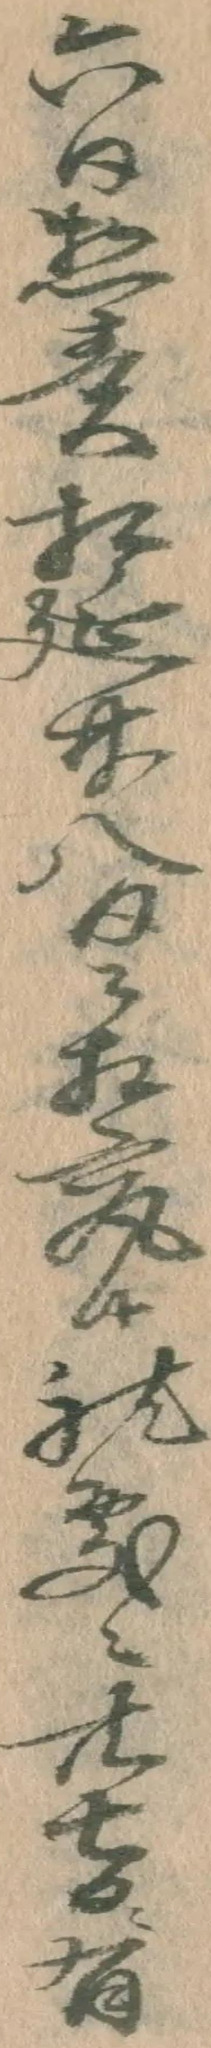六日惣責相延廿八日に相究候然處に廿七日有
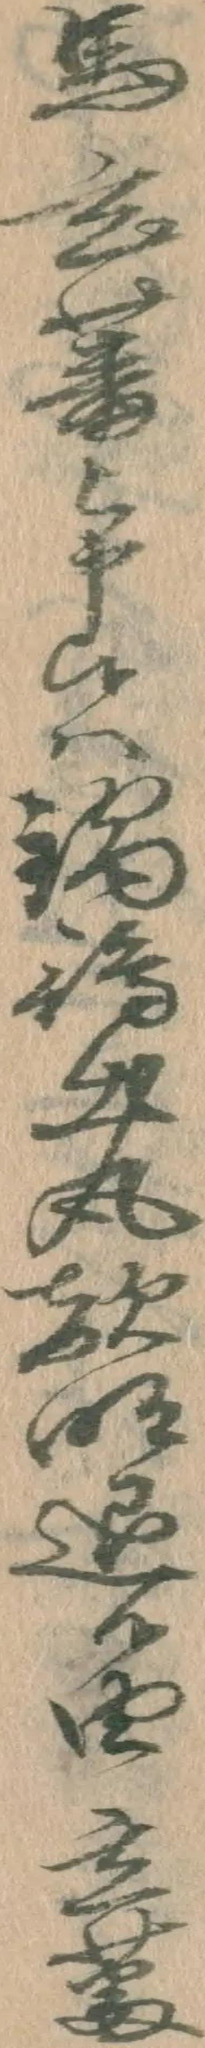馬玄蕃被申候は鍋島出丸敵明退候由玄蕃
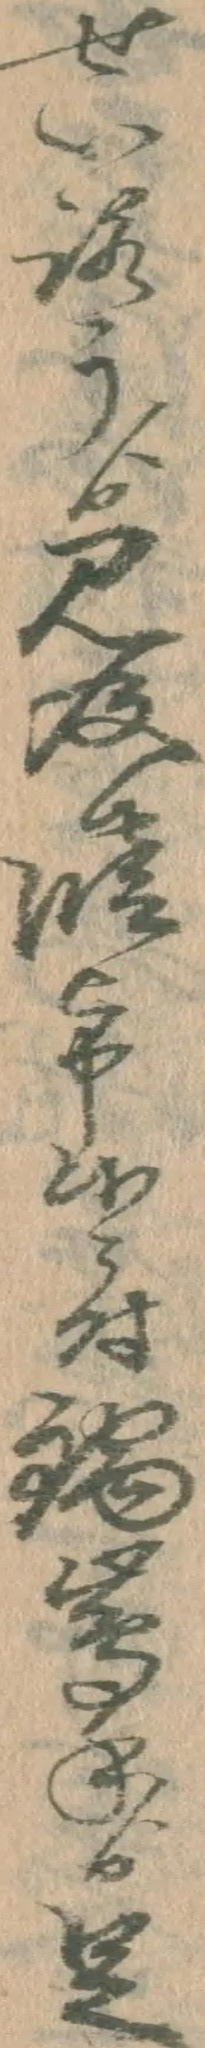せい路うゟ見及候段被申候に付鍋島手ゟ足
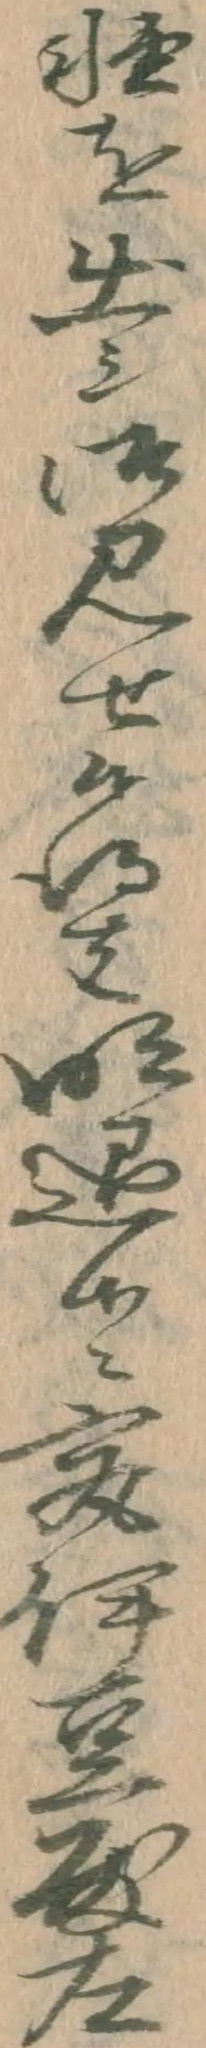軽を出し御見せ候得者明退候に究伊豆殿左
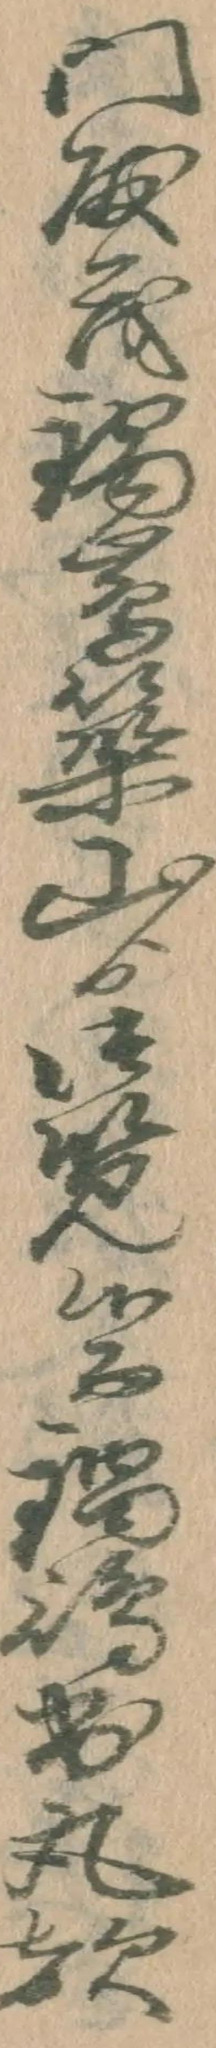門殿茂鍋島築山ゟ御覧候而鍋島出丸敵
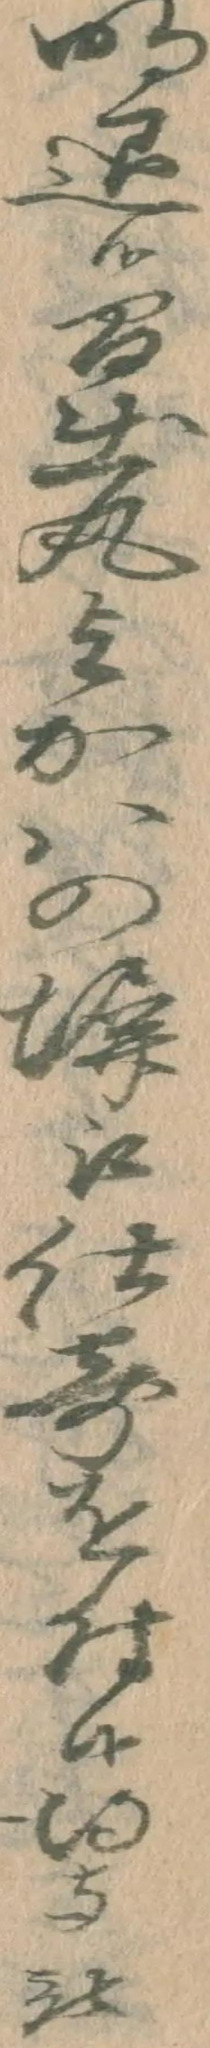明退候間出丸与かはの塀江仕寄を付候得与被
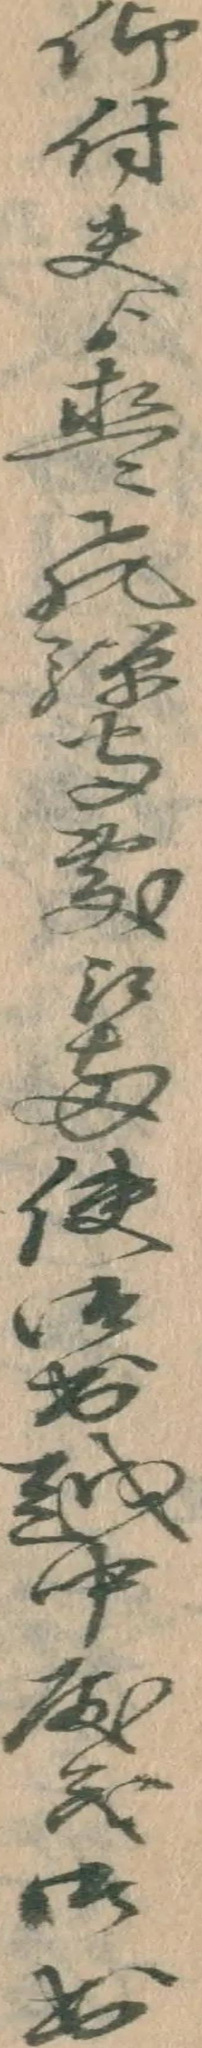仰付夫より直に飛騨守處江両使御出越中殿茂御出
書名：切支丹御退治記 49巻. [8]
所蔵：国立国会図書館 National Diet Library, JAPAN
